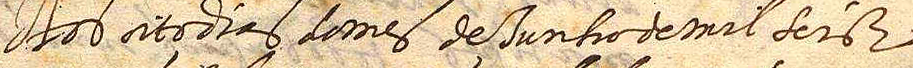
Aos oito dias do mes de Iunho de mil seis
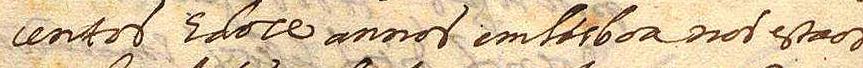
centos E doze annos em lisboa nos estaos
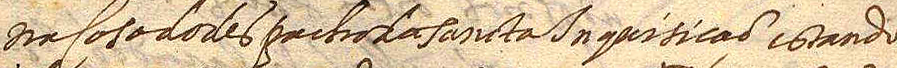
na Casa do despacho da sancta Inquisiçaõ estando
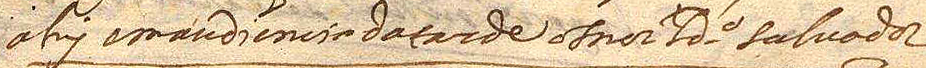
ahy em audiencia da tarde o snor Ldo saluador
